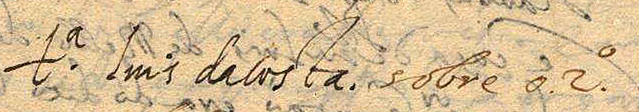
ta. Luis da costa. sobre o 2.o
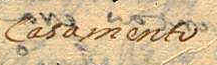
casamento
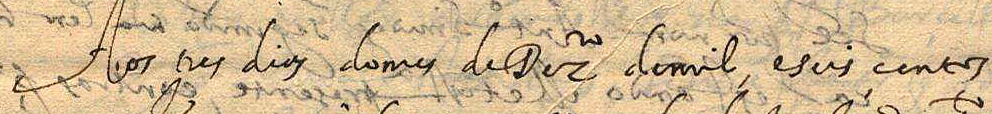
Aos tres dias do mes de Dezro de mil, e seiscentos
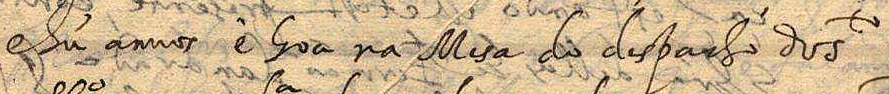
e hū annos ē Goa na Mesa do despacho do sto
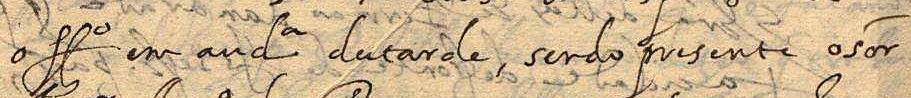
offo em auda da tarde, sendo presente o sōr
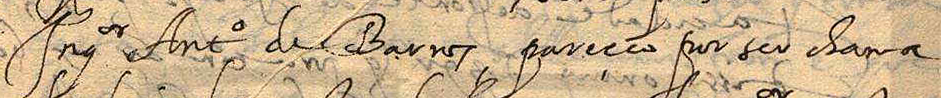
Jnqor Anto de Barros, pareceo por ser chama
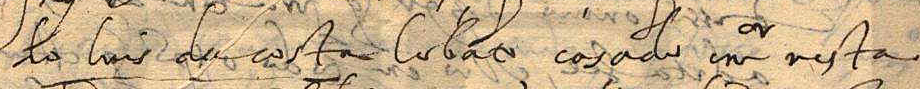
do luis da costa lobato casado e mor nesta
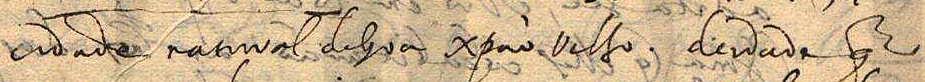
cidade natural de Goa xpaõ velho. de idade q̄
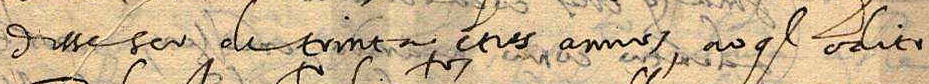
disse ser de trinta e tres annos, ao q̄ o dito
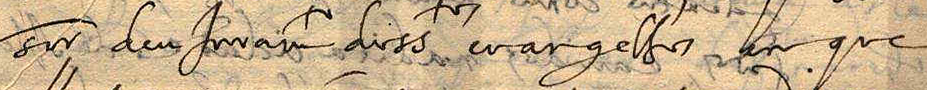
s̄or deu Juramto dos stos evangelhos em que
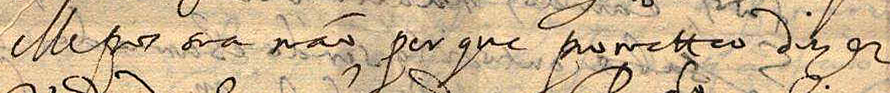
elle pos sua maõ porque prometteo dizer
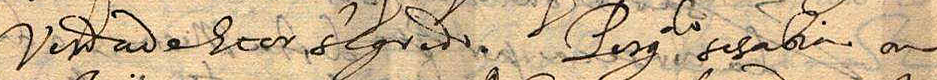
Verdade E ter segredo. Pergdo se sabia ou
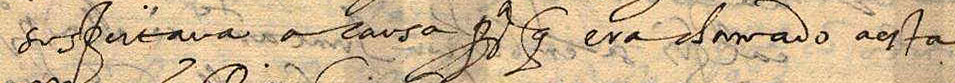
sospeitava a causa ꝑa q̄ era chamado a esta
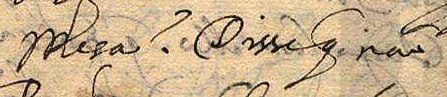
mesa? Disse q̄ naõ
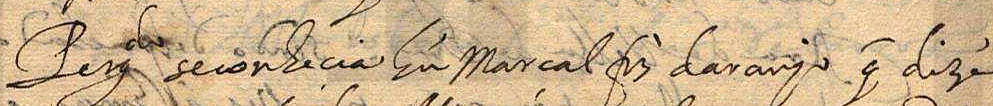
Pergdo se conhecia hū Marçal frz̄ daraujo q̄ dizē
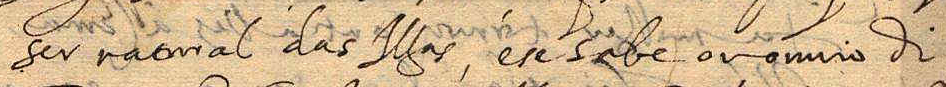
ser natural das Ilhas, e se sabe ou ouuio di
